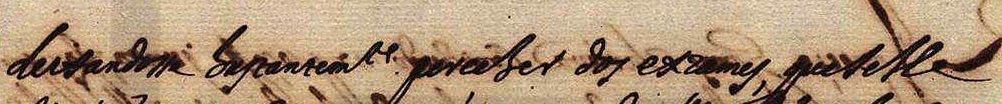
deixandosse bastantem.te perceber dos exzames que se lhe
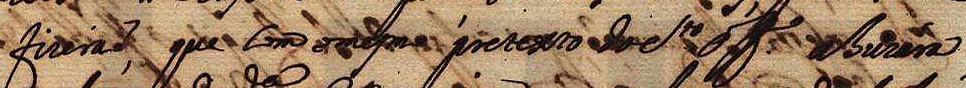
fizeraõ, que com o mesmo pretexto do S.to Off.o abuzara
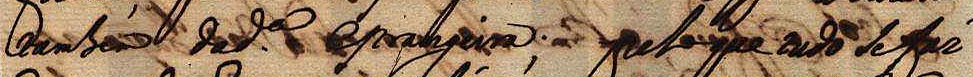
tambem da d.a estrangeira; pelo que tudo se faz
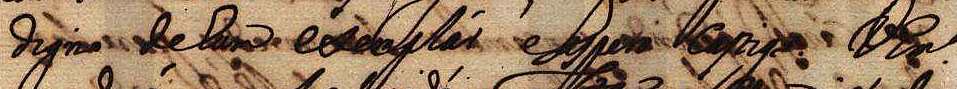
digno de hum exemplar e aspero castigo. V Em.a
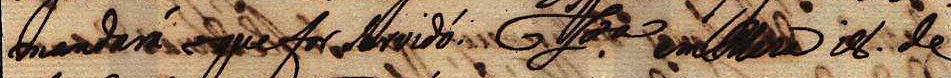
mandará o que for servido. Lx.a em Meza 18. de
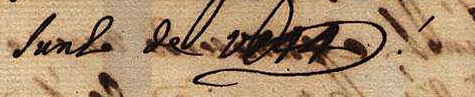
Iunho de 1744!
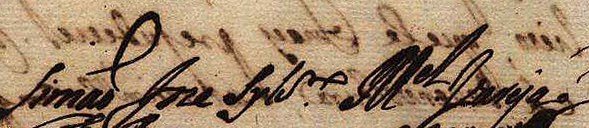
Simaõ Joze Syl.ro M.el Varejaõ
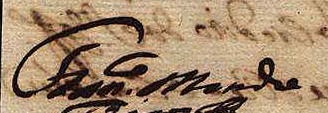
Fran.co Mendo
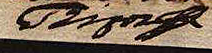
Trigozo
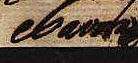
e Tavora
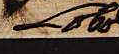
Lobo
